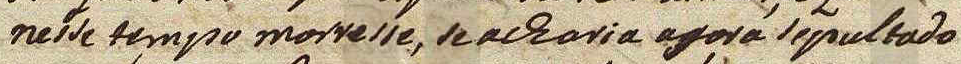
nesse tempo morresse, se acharia agora sepultado
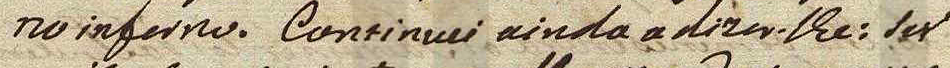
no inferno. Continuei ainda a dizer-lhe: ser
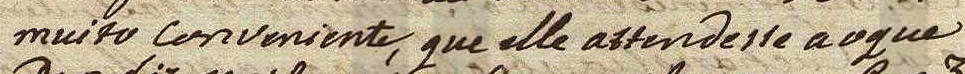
muito conveniente, que elle attendesse ao que
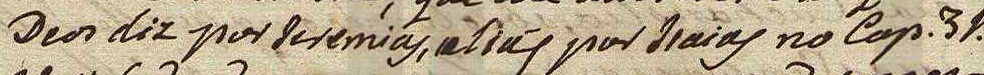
Deos diz por Ieremias, aliás por Isaias no Cap. 31.
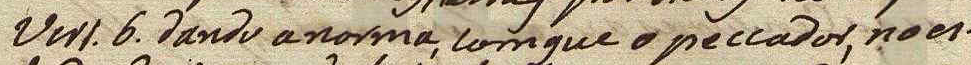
Vers. 6. dando a norma, com que o peccador, no es
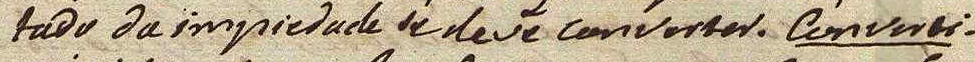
tado da impiedade se deve converter. Converti
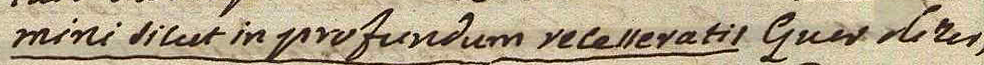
mini sicut in profundum recesseratis Quer dizer,
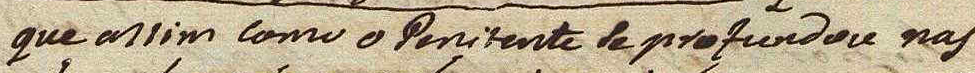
que assim como o Penitente se profundou nas
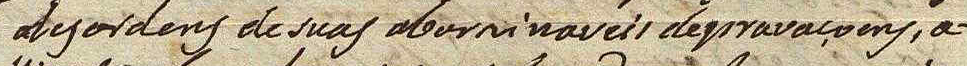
desordens de suas abominaveis depravaçoens, a
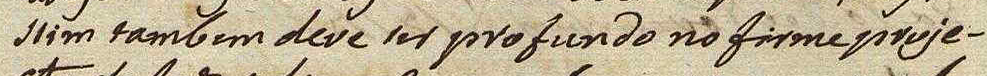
ssim tambem deve ser profundo no firme proje
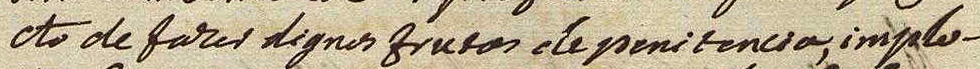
cto de fazer dignos frutos de penitencia, implo
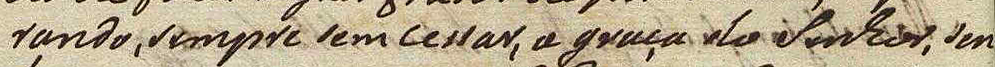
rando, sempre sem cessar, a graça do Senhor, sen
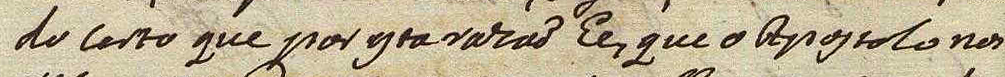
do certo que por esta razaõ he que o Apostolo nos
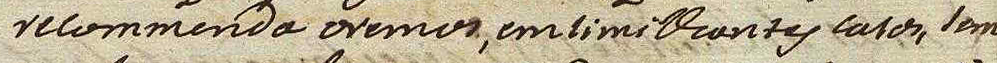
recommenda oremos, em similhantes casos, sem
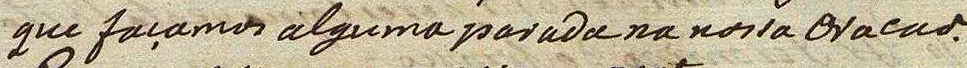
que façamos alguma parada na nossa Oraçaõ.
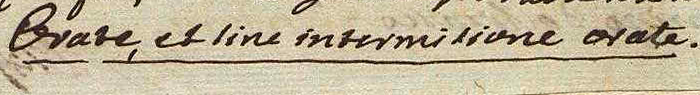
Orate, et sine intermisione orate.
